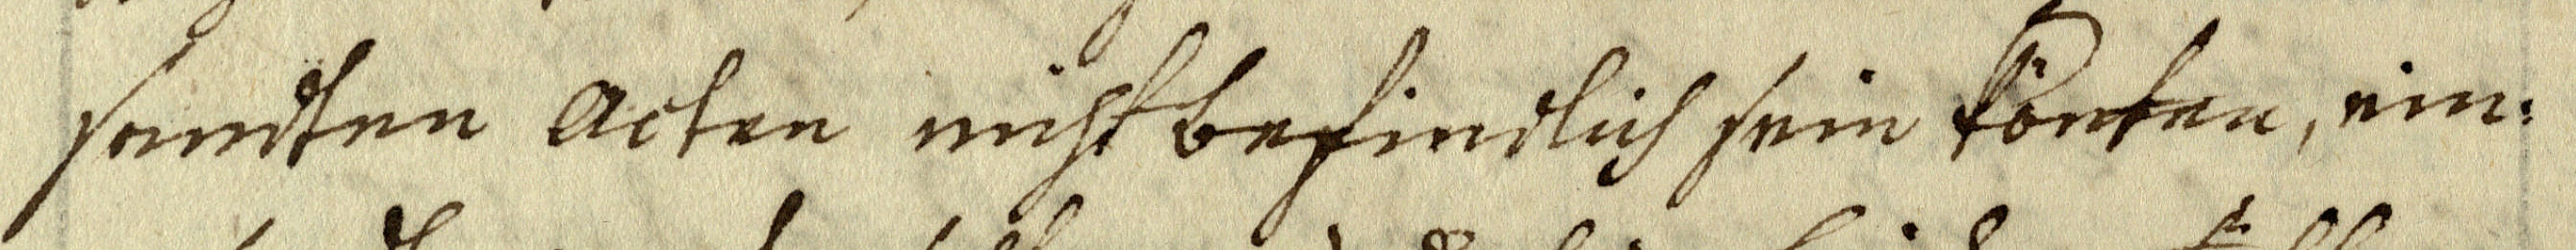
sandten Acten nichtbefindlich sein könten, ein¬
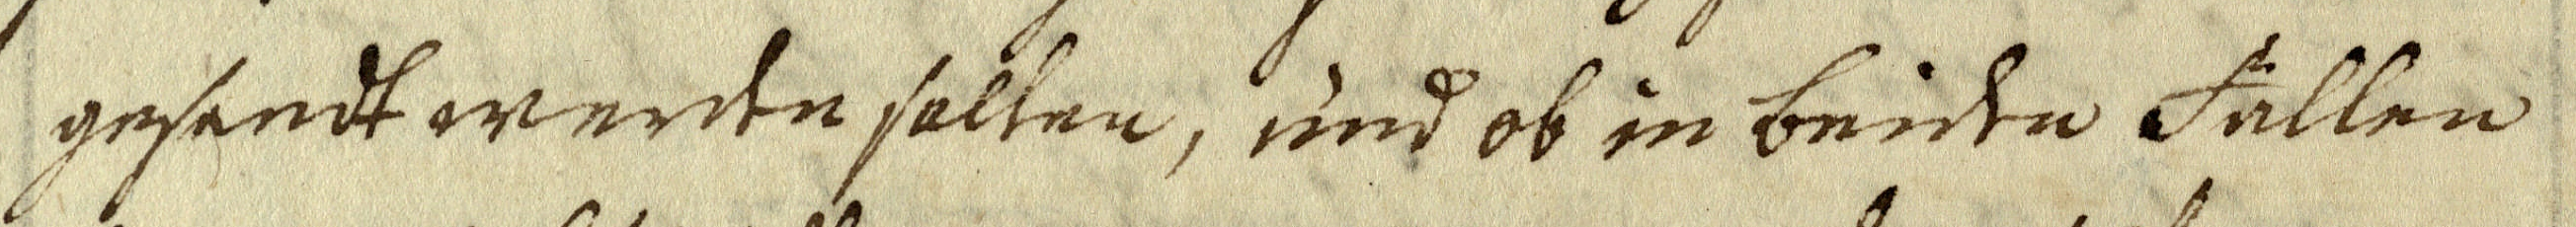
gesandt werden solten, undob in beiden Fällen
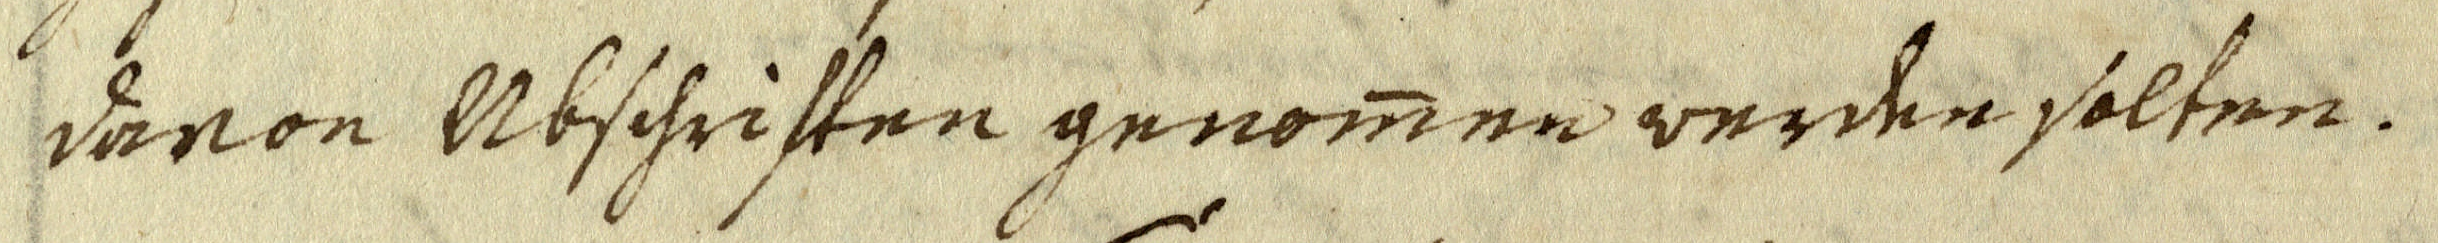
davon Abschriften genomen werden solten.
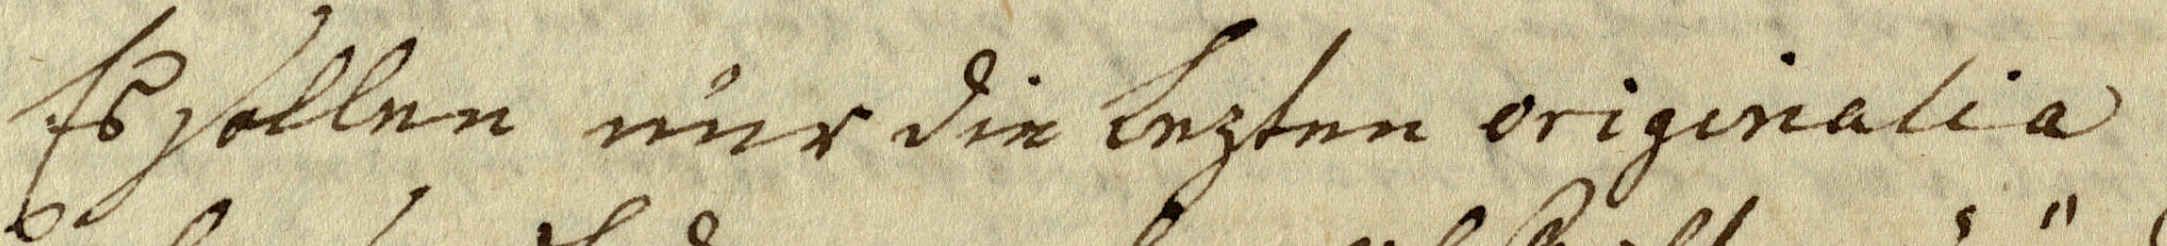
Es sollen nur die lezten originalia
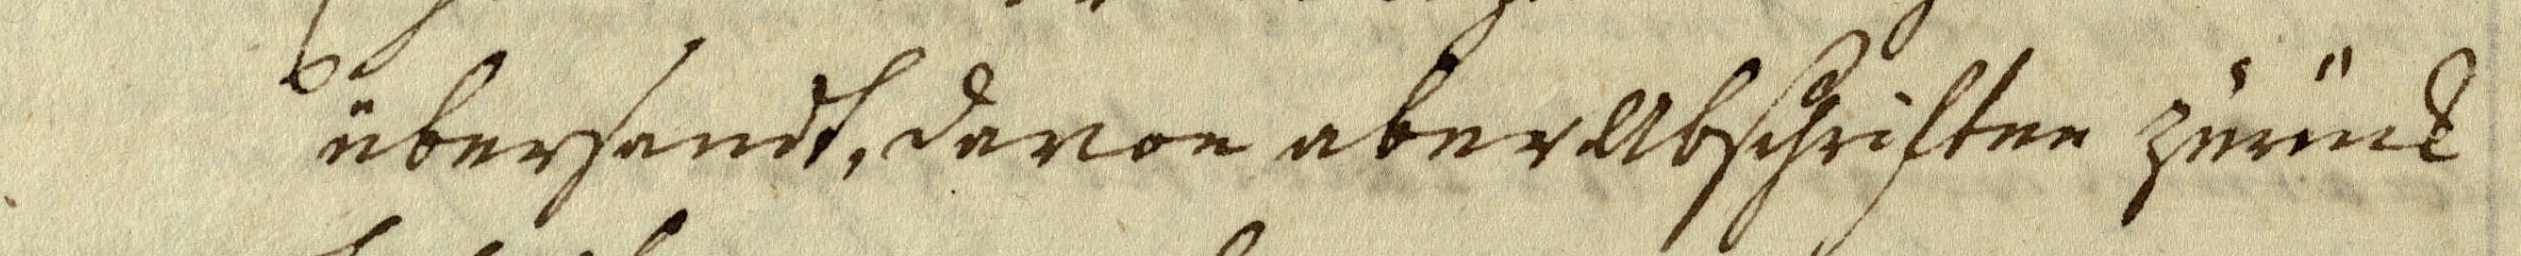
übersandt, davon aber Abschriften zurück
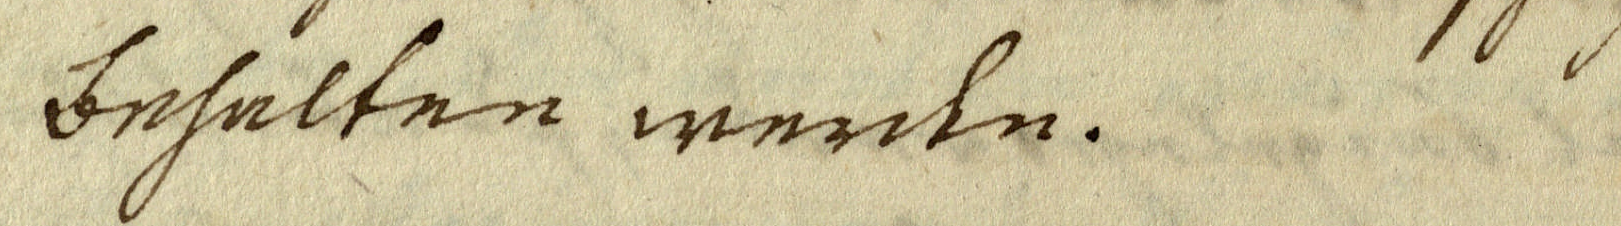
behalten werden.
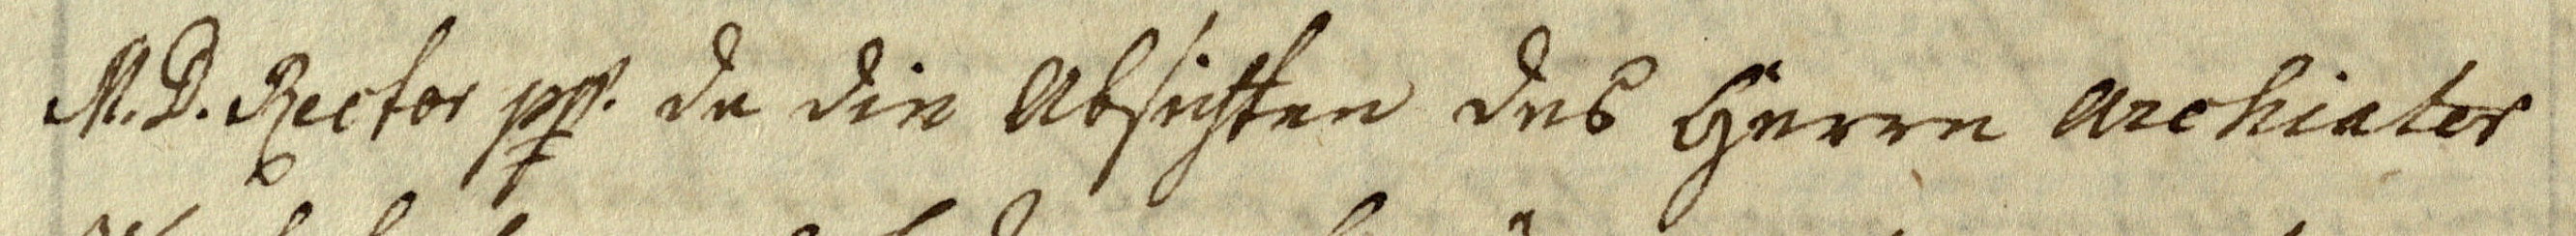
M. D. Rector pp. Da die Absichtendes Herrn Archiater
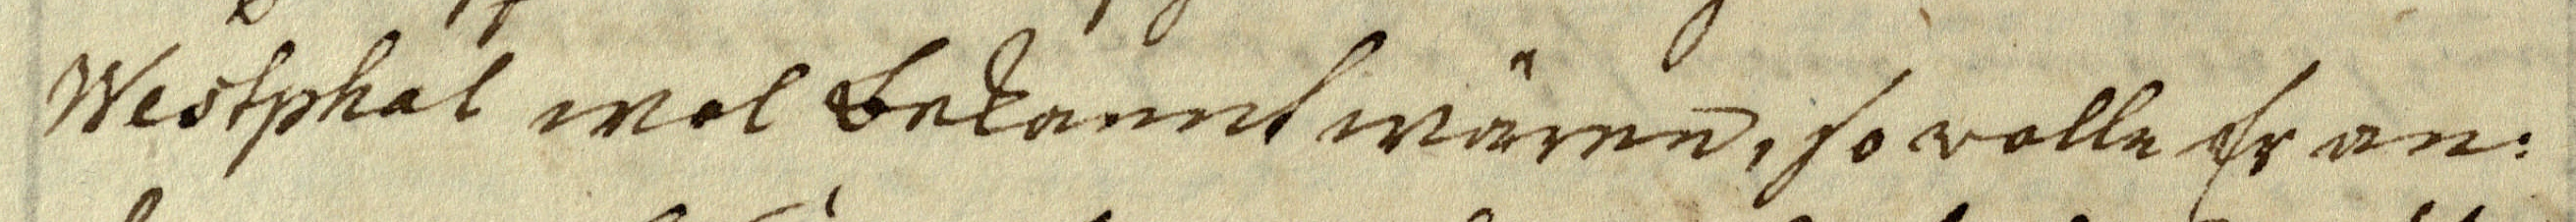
Westphal wol bekannt wären so wolle Er an¬
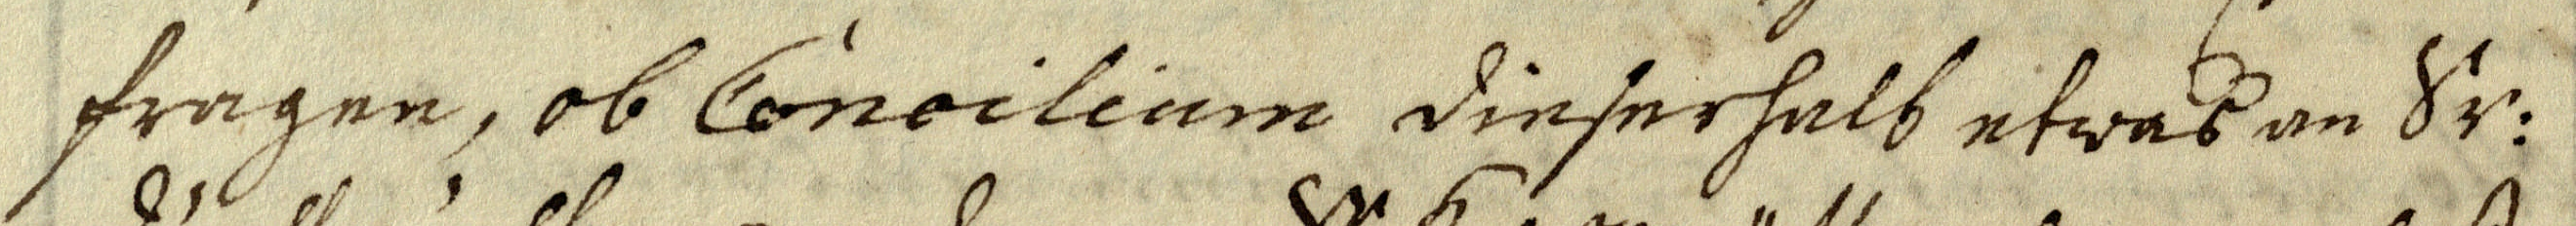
fragen, ob Concilium dieserhalb etwas an Sr
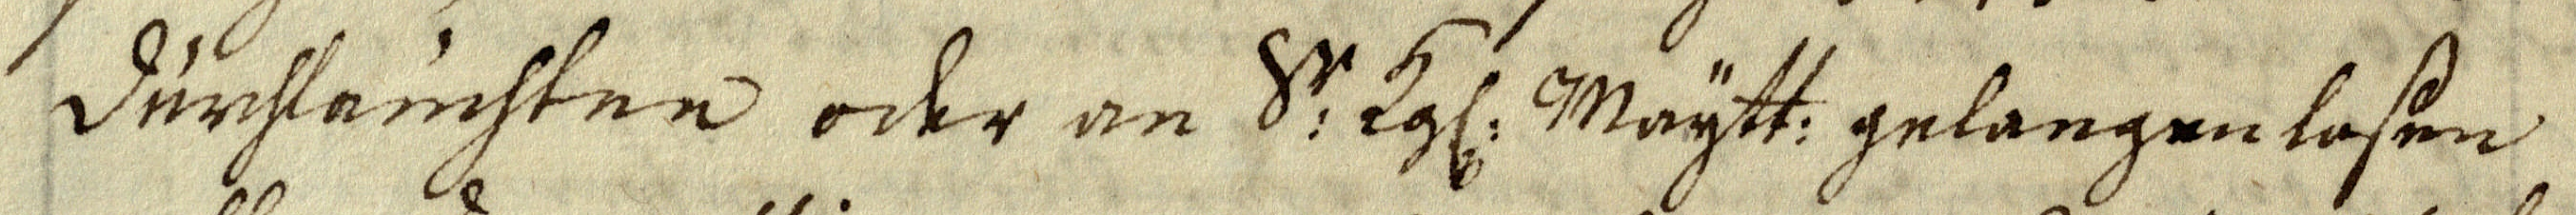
Durchlauchten oder an Sr Kgl. Maÿtt. gelangen laßen
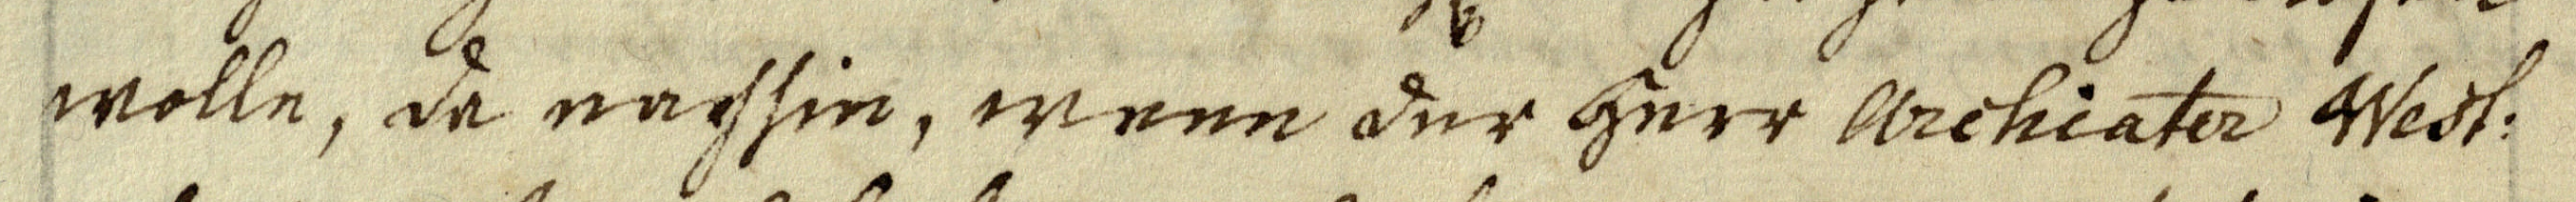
wolle, da nachhin, wenn der Herr Archiater West¬
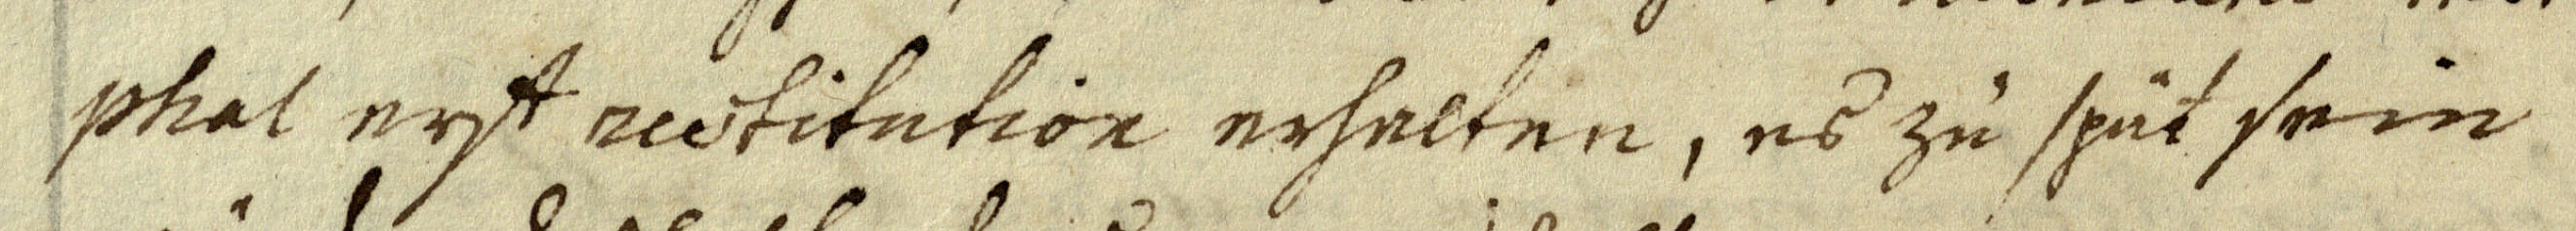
phal erst restitution erhalten, es zu spät sein
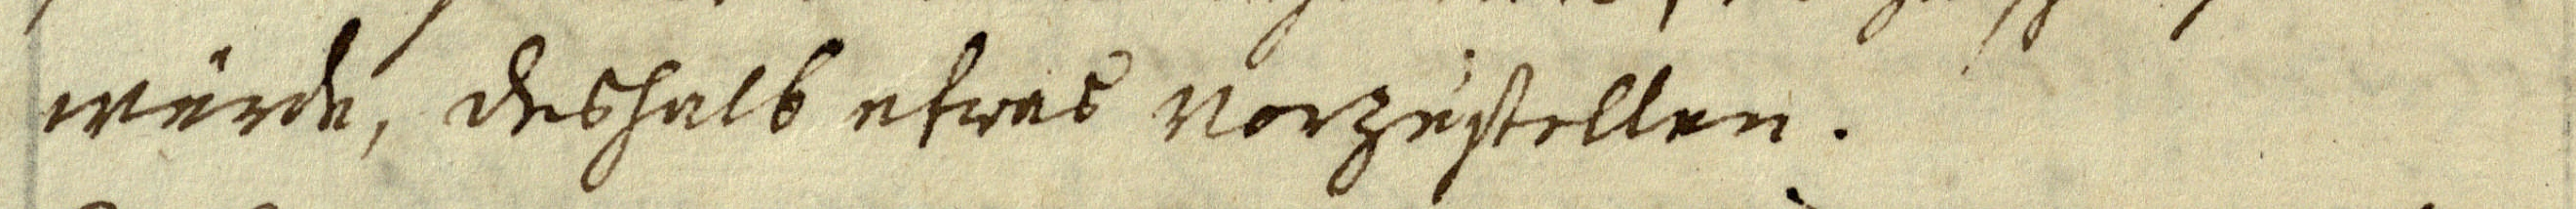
würde, deshalb etwas vorzustellen.
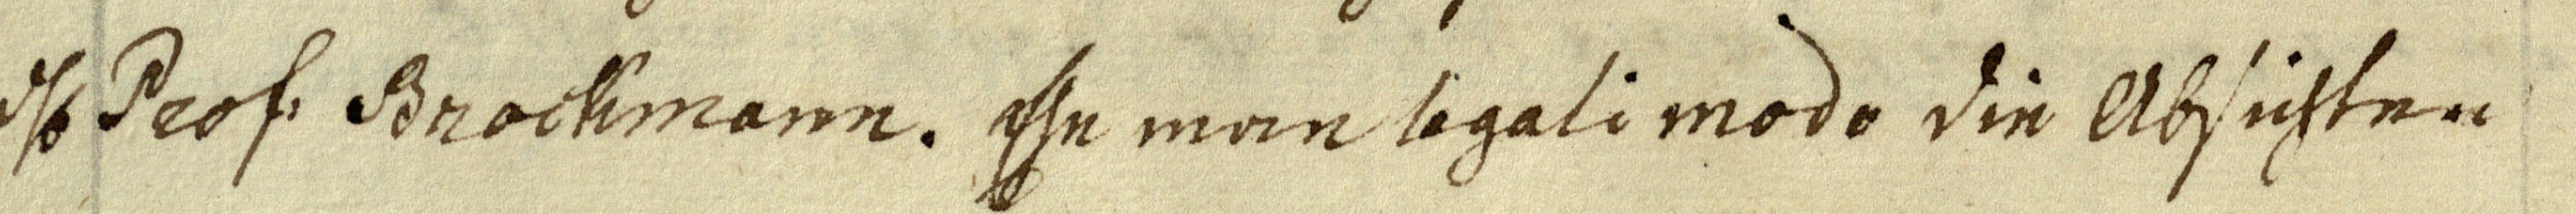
dh. Prof. Brockmann. Ehe man legali modo die Absichten
